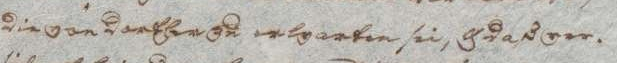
die von dorther zu erwarten sei, & daß ver-
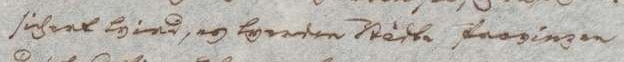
sichert wird, es werden Städte, Provinzen
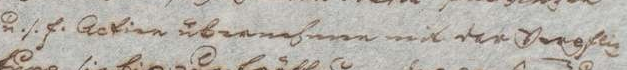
u. s. f. Actien übernehmen mit der Verpflich-
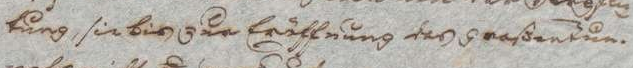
tung, sie bis zur Eröffnung des großen Tun-
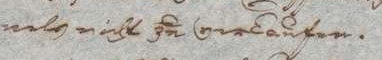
nels nicht zu verkaufen.
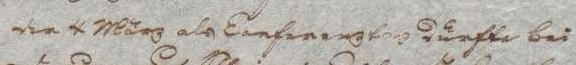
Der 4 März als Conferenztag dürfte bei
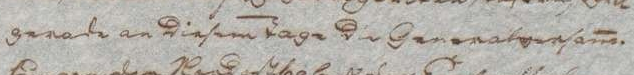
gerade an diesem tage die Generalversamm-
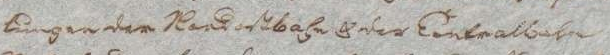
lungen der Nordostbahn & der Centralbahn
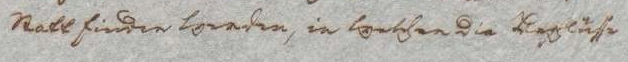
Statt finden werden, in welchen die Beschlüsse
